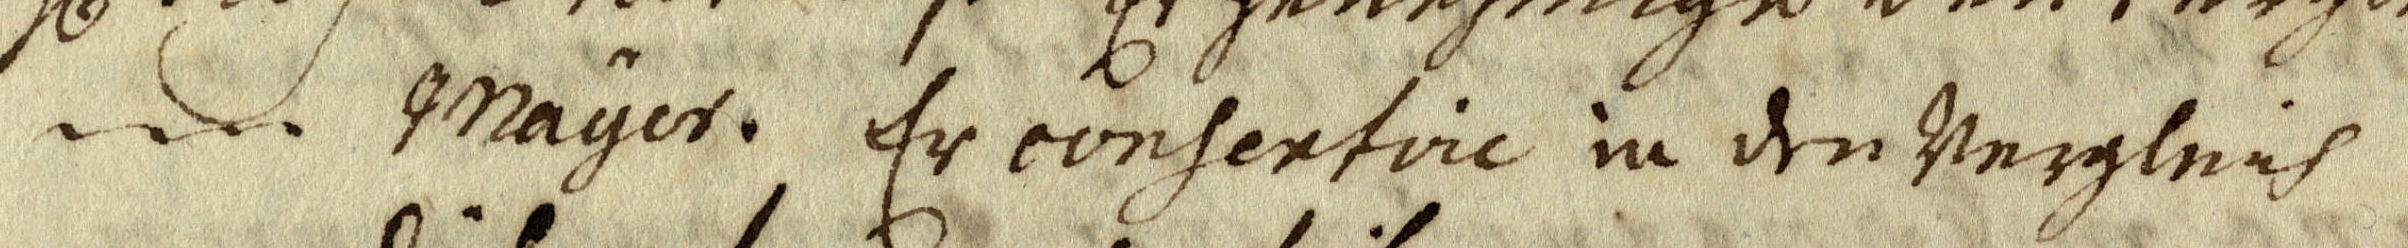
Maÿer. Er consentire in den Vergleich.
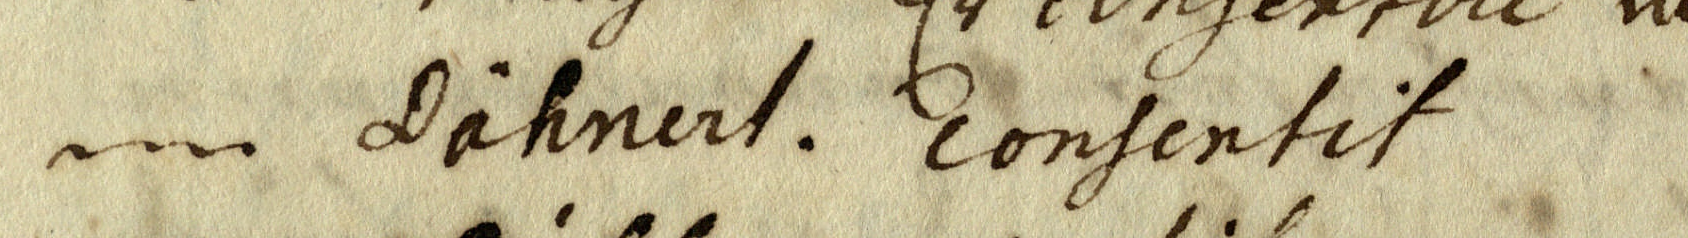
Dähnert. consentit.
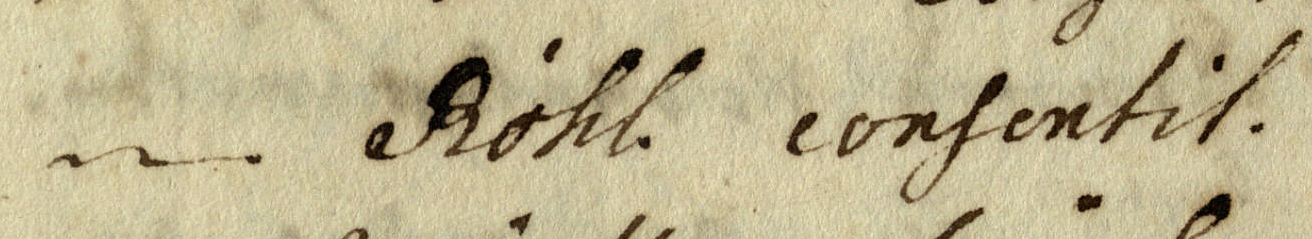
Röhl. consentit.
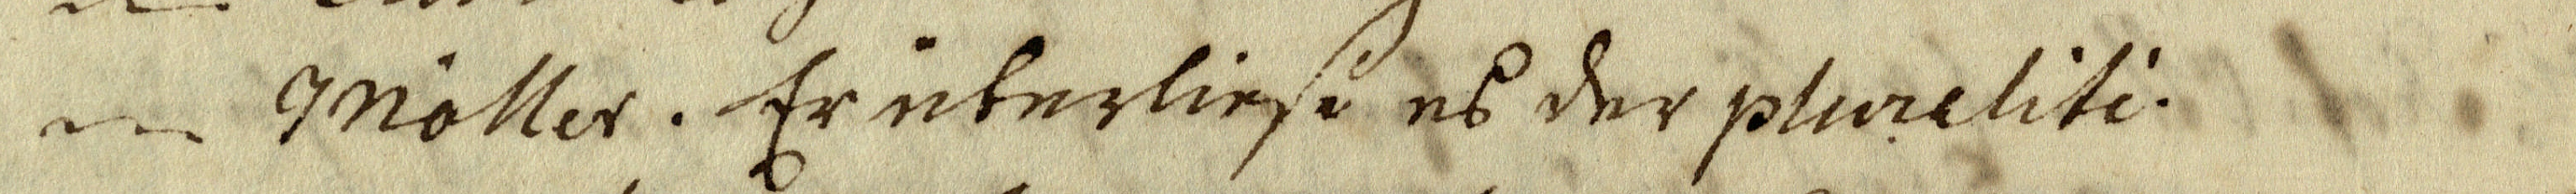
Möller. Er überließe es der pluraliti.
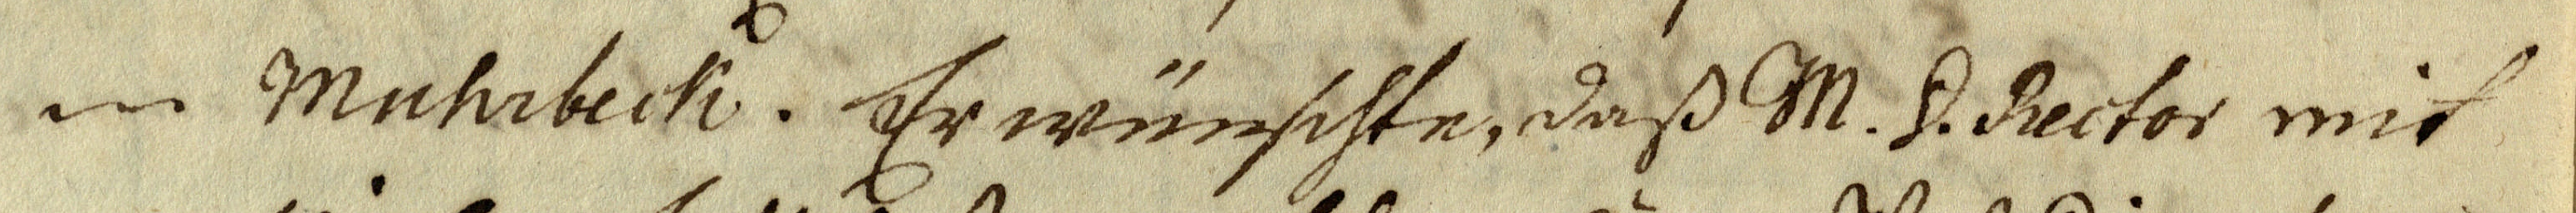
Muhrbeck. Er wünschte, daß M. D. Rector mit
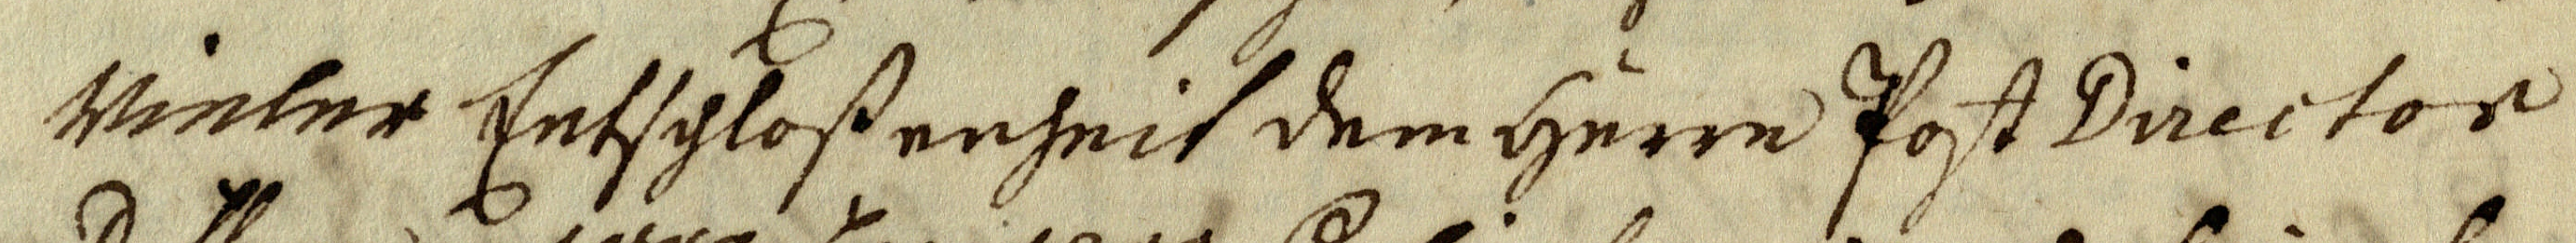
vieler Entschloßenheit dem Herrn Post Director
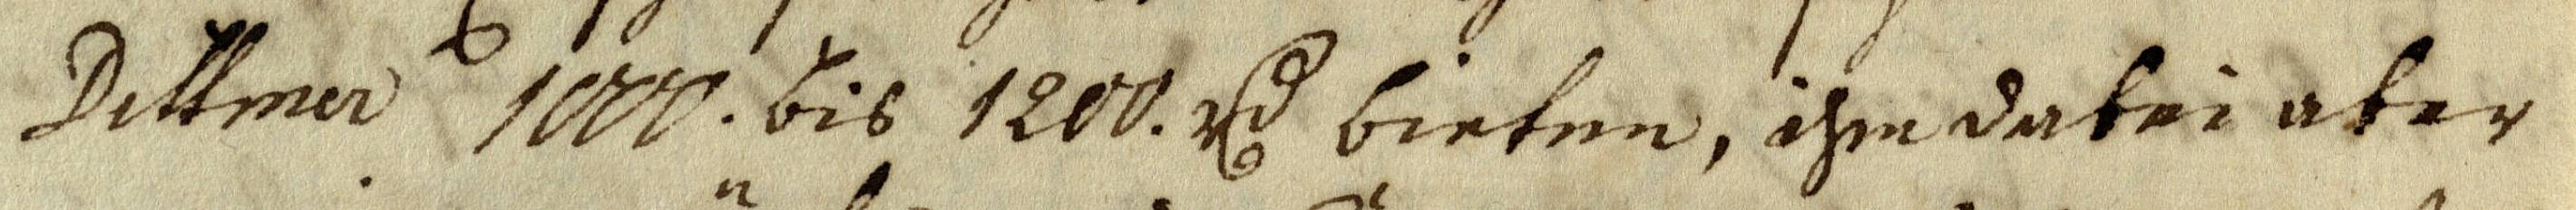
Dittmer 1000. bis 1200 r. bieten, ihm dabei aber
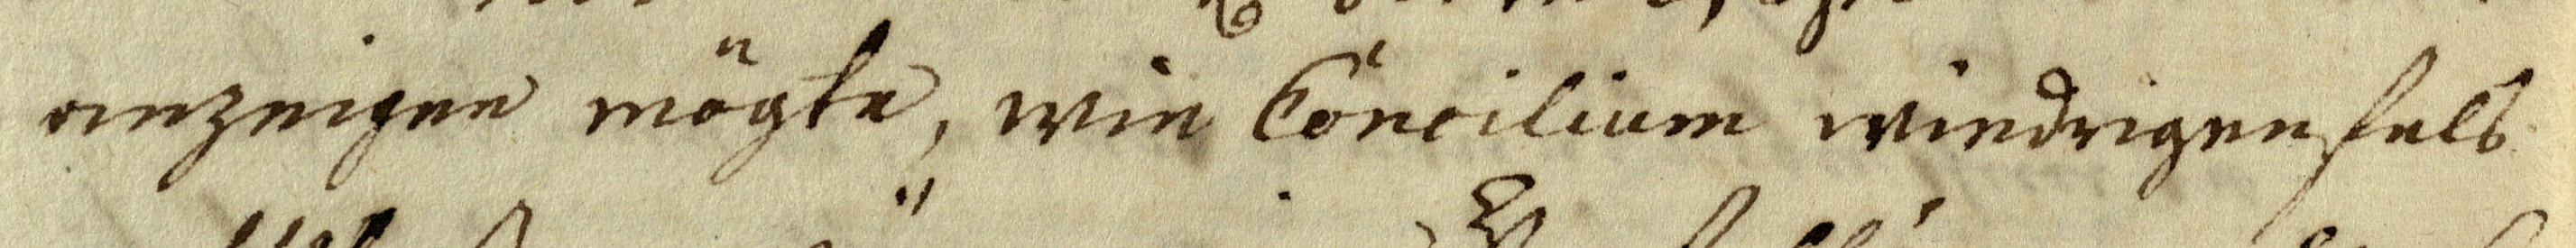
anzeigen mögte, wie Concilium wiedrigenfals
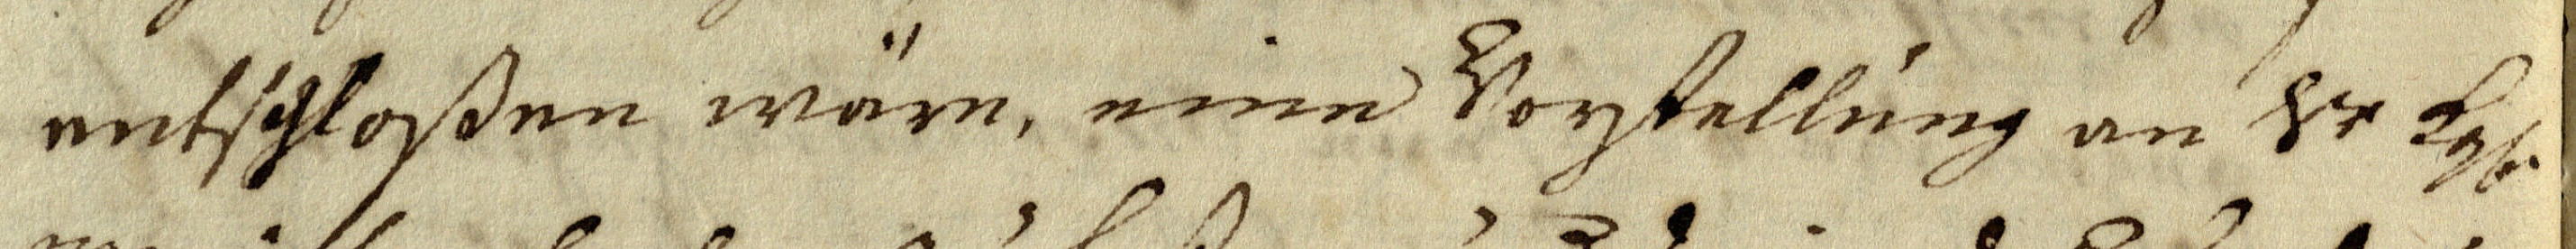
entschloßen wäre, eine Vorstellung an S. Kgl.
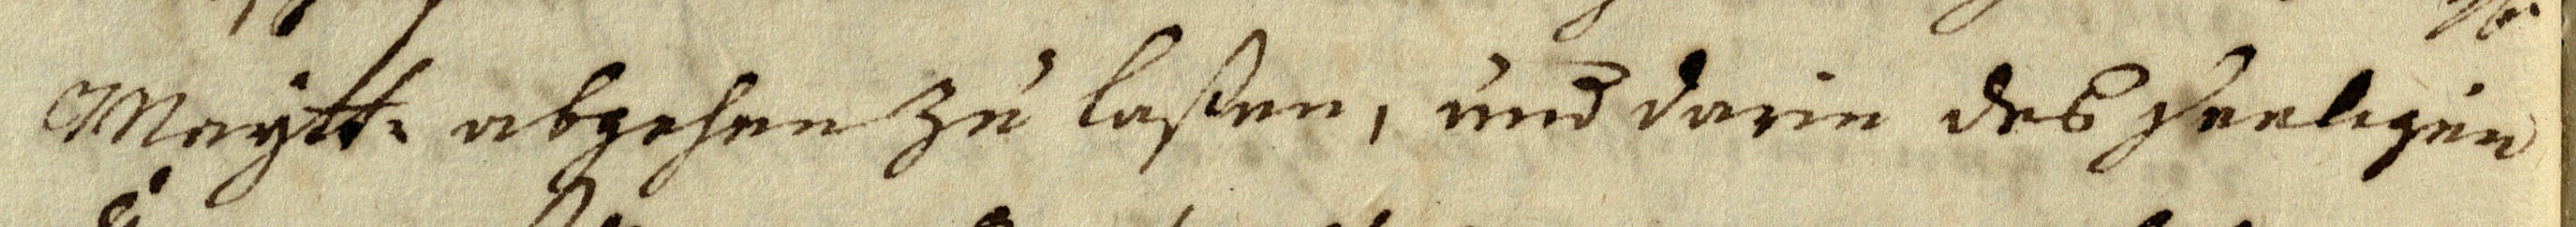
Maÿtt. abgehen zu laßen, und darin des seeligen
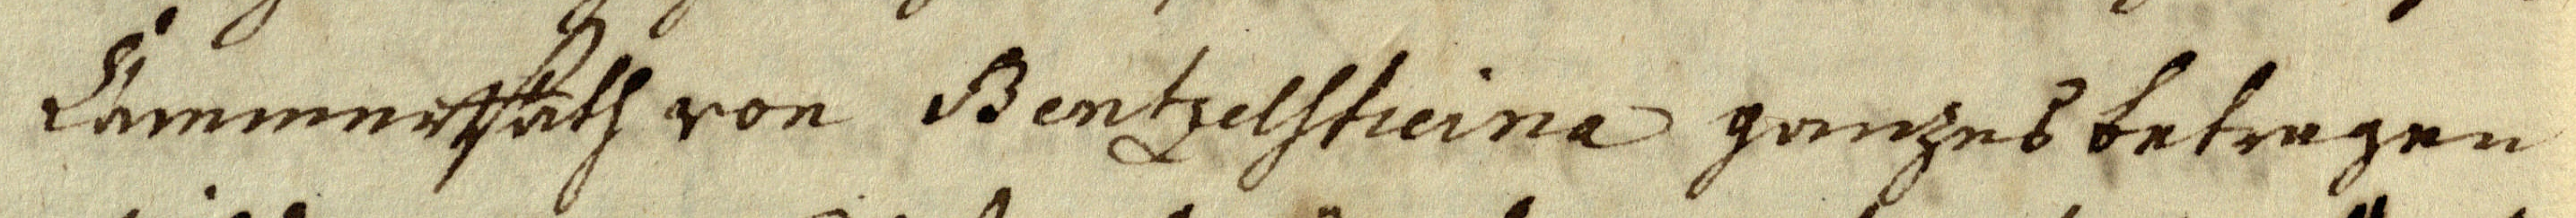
CammerRath von Bentzelstierna ganzes Betragen
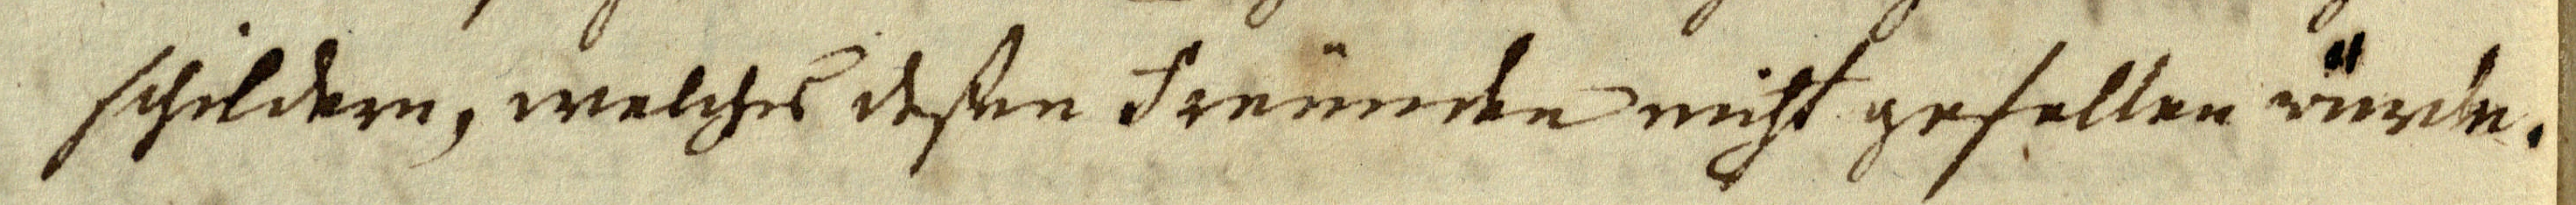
schildern, welches deßen Freunden nicht gefallen würde.
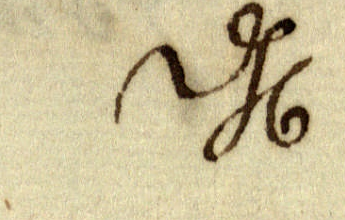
dh
